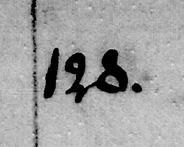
25.
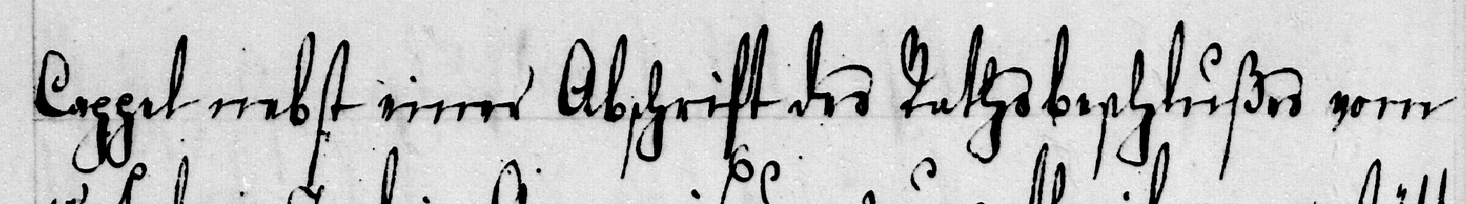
Cappel nebst einer Abschrift des Rathsbeschlußes vom
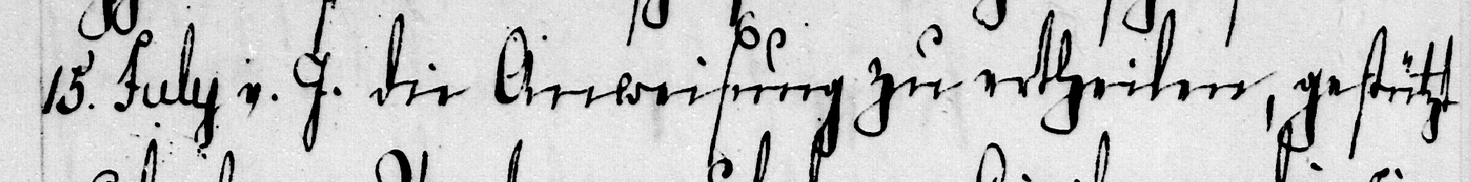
15. July v. J. die Anweisung zu ertheilen, gestützt
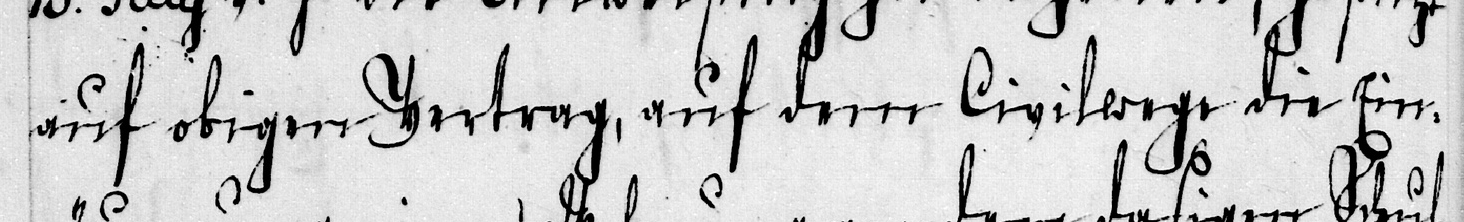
auf obigen Vertrag, auf dem Civilwege die Ein¬
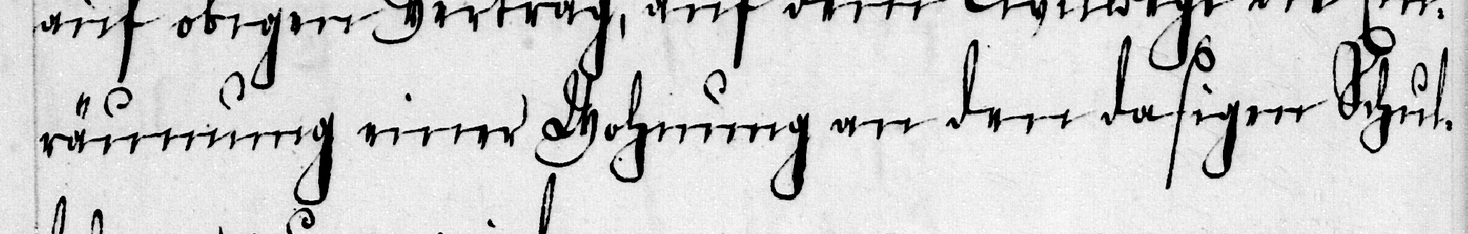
räumung einer Wohnung an den dasigen Schul¬
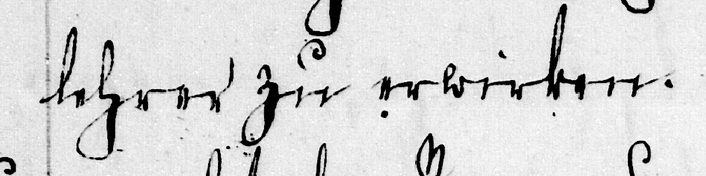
lehrer zu erwirken.
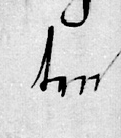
den
